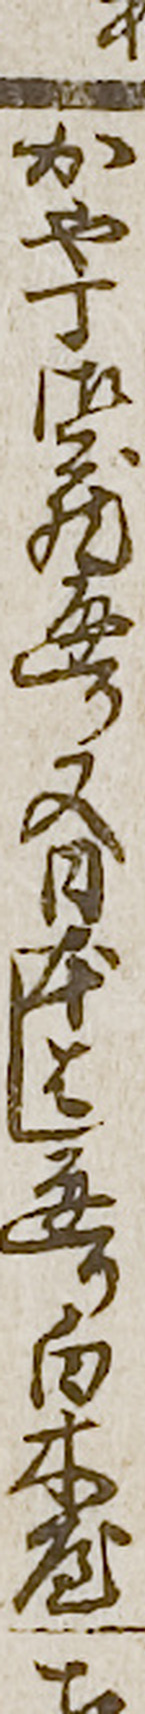かや丁御蔵通り又日本はし通り白木屋
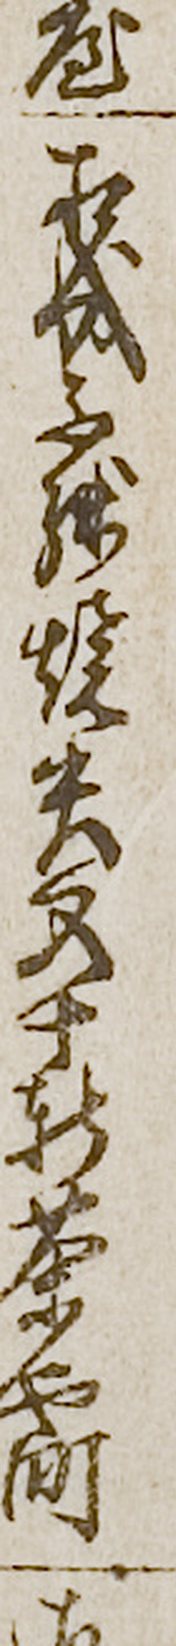相成不残焼失五十軒新茶や町
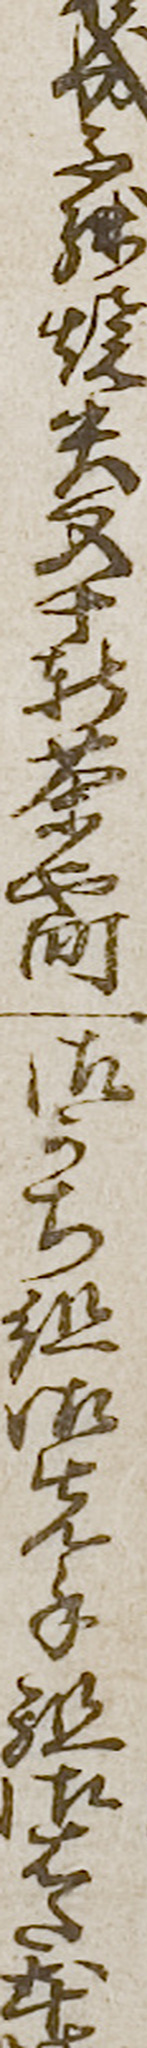相成不残焼失五十軒新茶や町
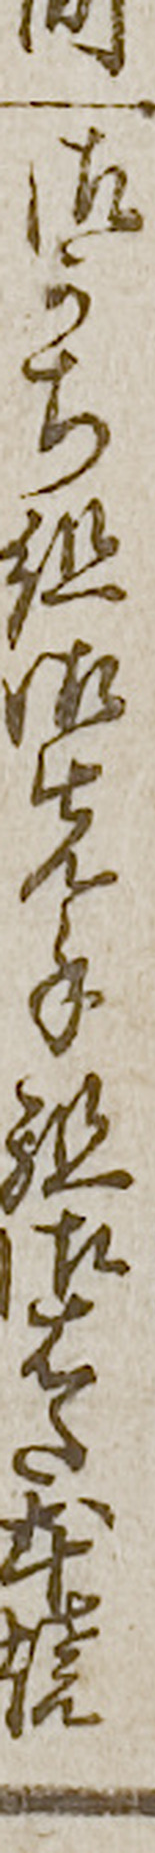御かち組御先手組御はた本焼
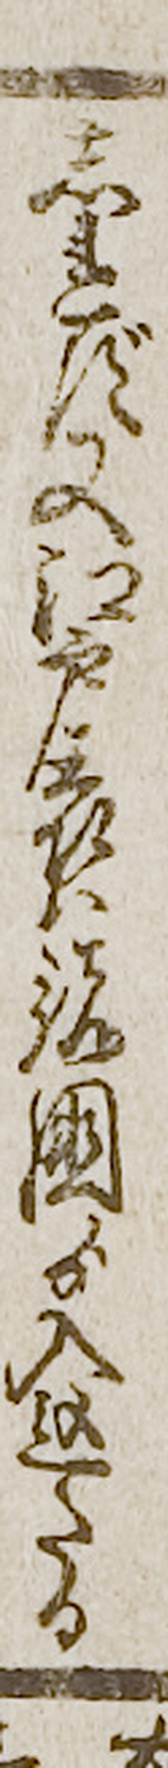しれず又江戸表は諸国ゟ入込たる
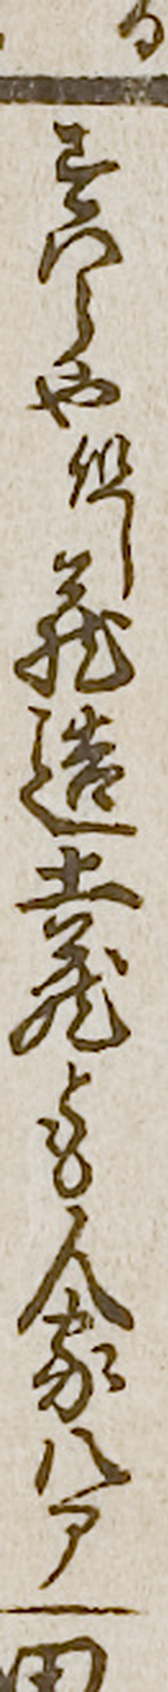すはら屋但し蔵造土蔵とも人家八部
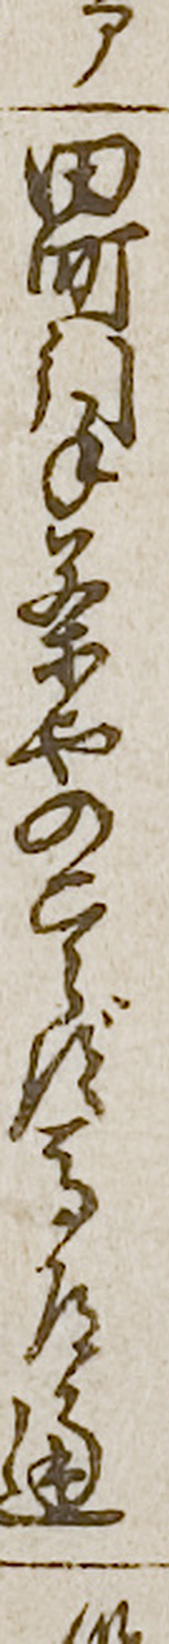田町引手茶やのこらず馬道通
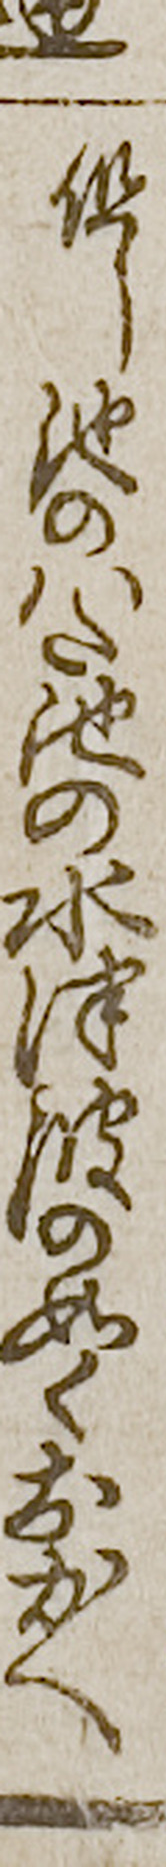但し池のはた池の水津波の如くおかへ
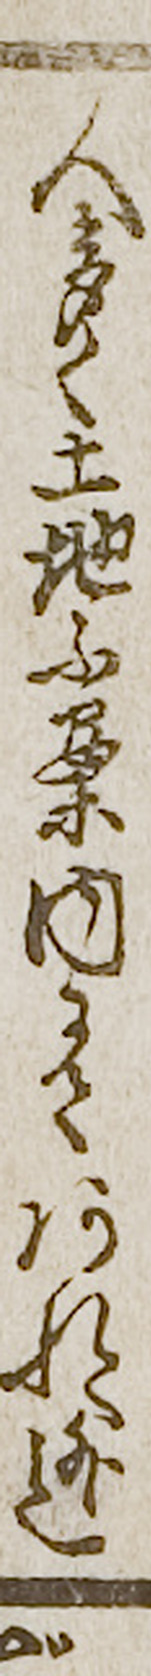人多く土地不案内にて何れへ逃
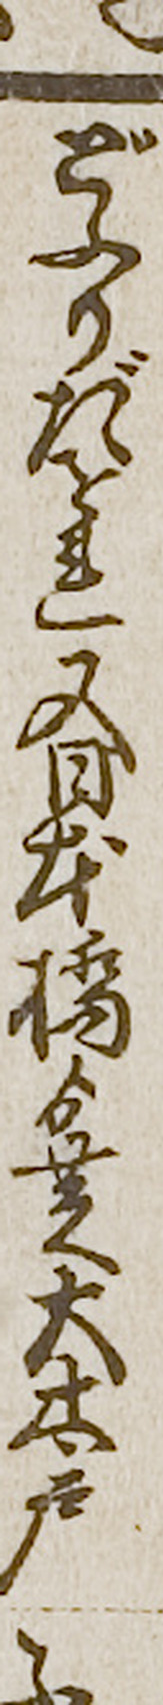どふりだをれ又日本橋ゟ芝大木戸
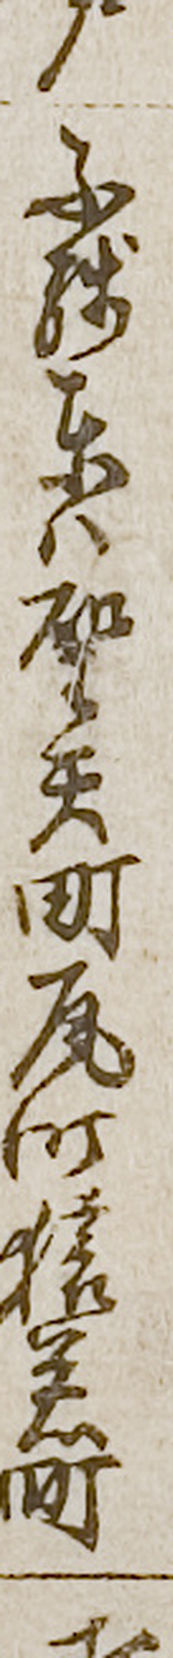不残東は聖天町瓦町猿若町
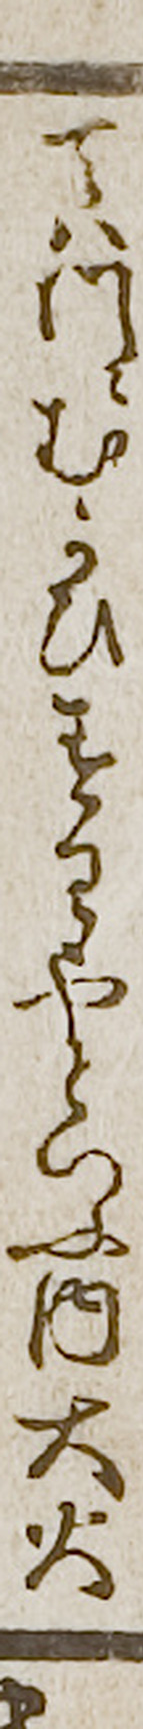ては門にむかひすわやといふ内大火
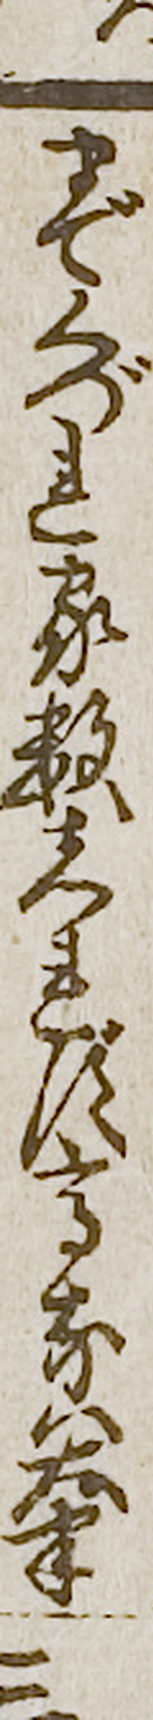までくづれ家数しれず高なは大半
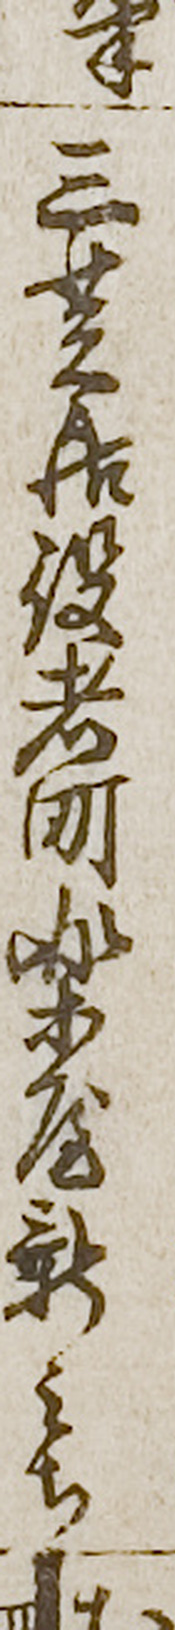三芝居役者町楽屋新みち
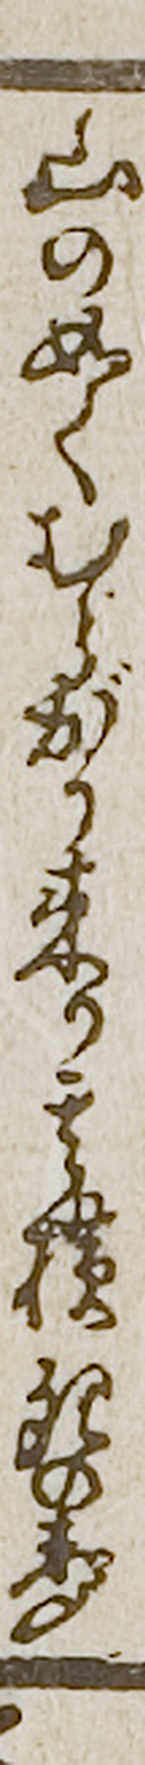山の如くむらがり来り其横死の声
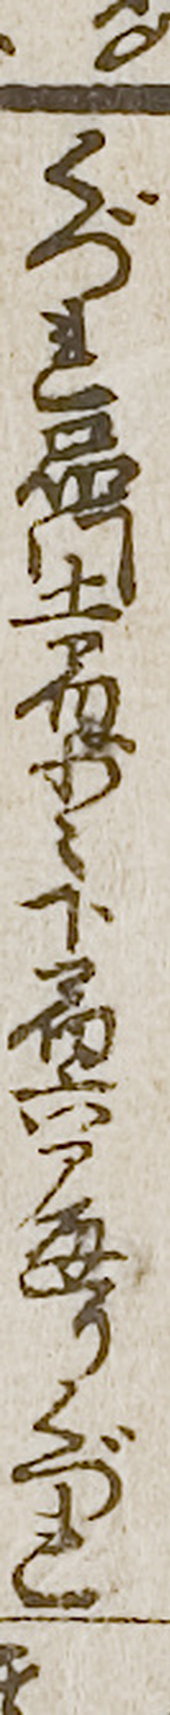くづれ品川土宿少々下宿六部通りくづれ
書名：東都珍事実録咄
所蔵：東京大学総合図書館 General Library in the University of Tokyo, JAPAN
